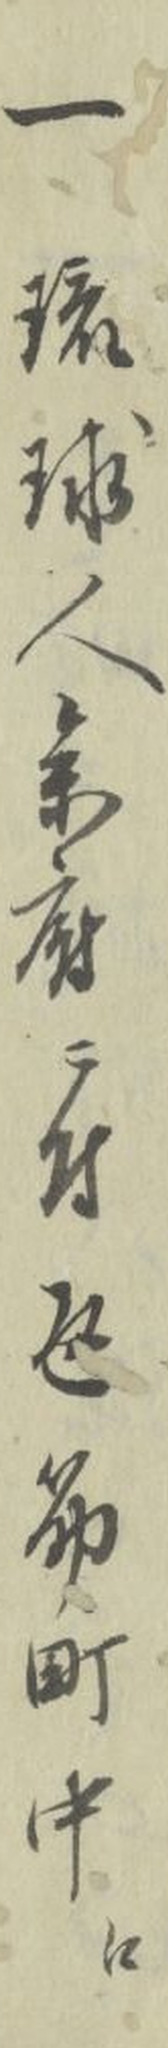一琉球人参府に付通筋町中え
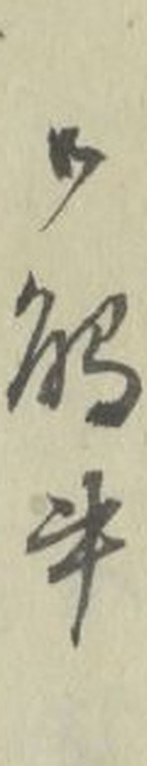御触書
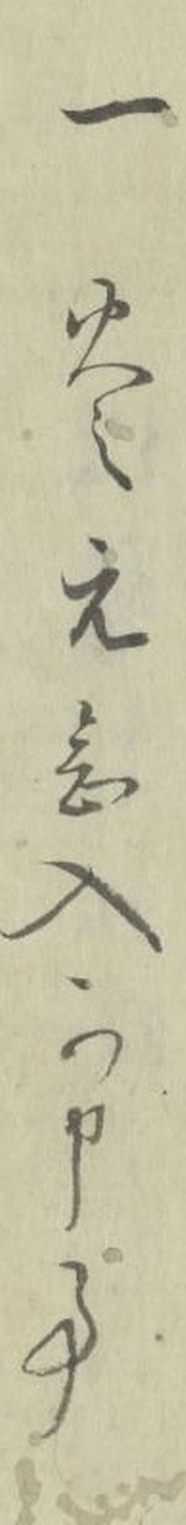一火之元念入可申事
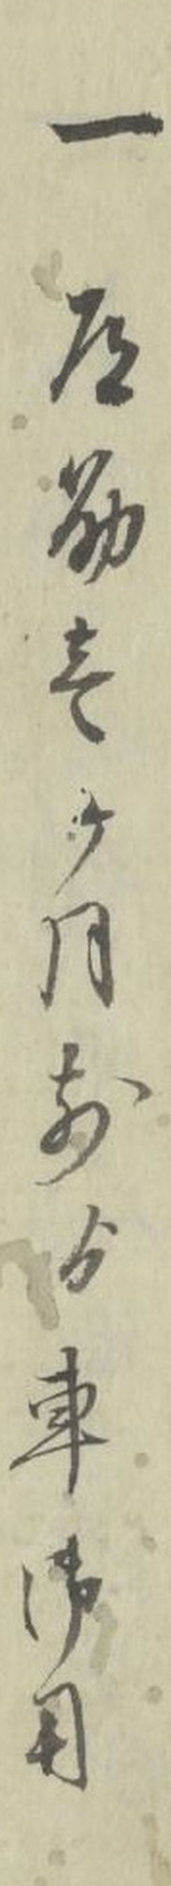一道筋壱ヶ月前ゟ車御用
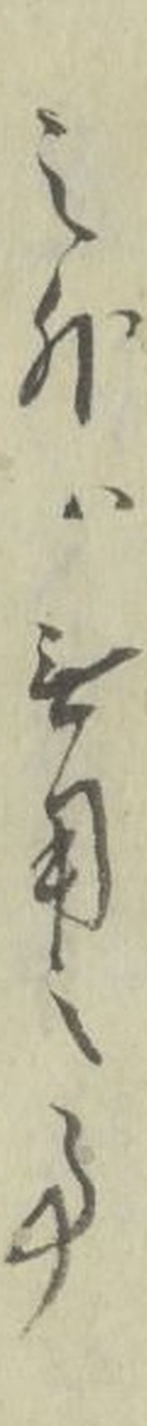之外は無用之事

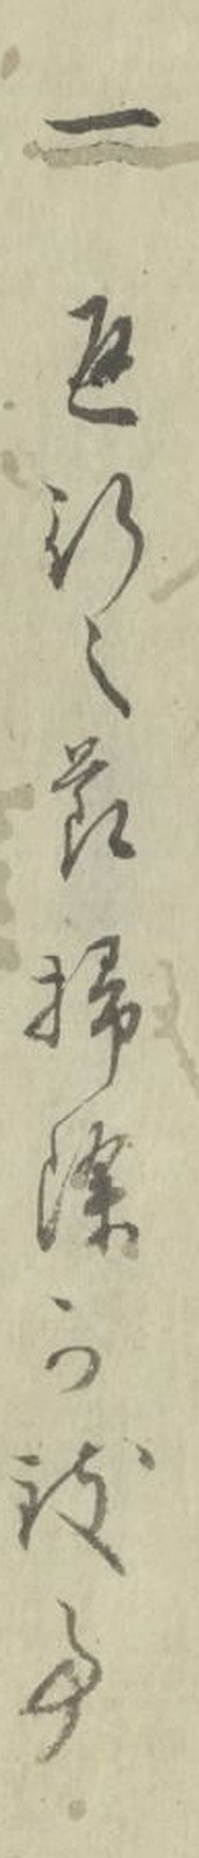一通行之節掃除可致事
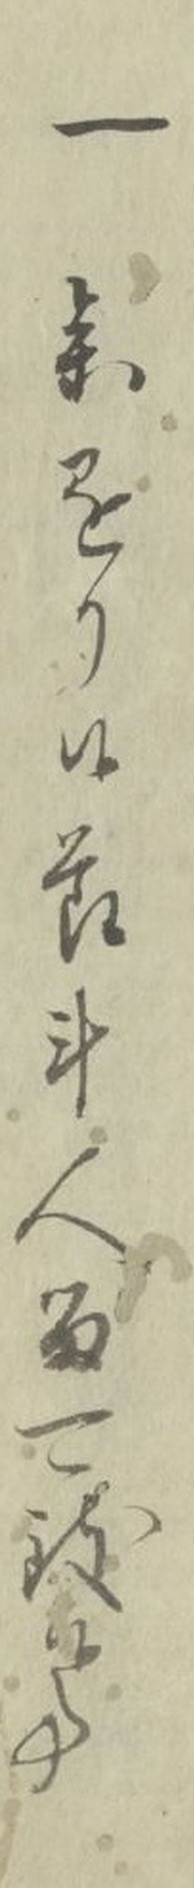一参懸り候節計人留可致候事
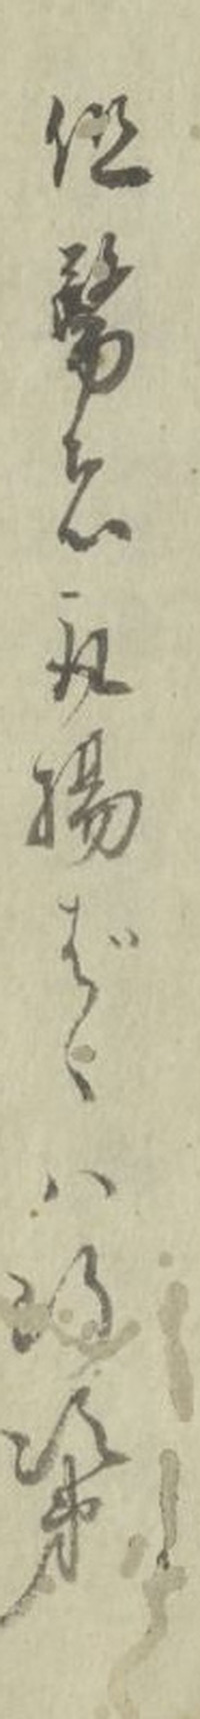但医者取揚ばゝは断次第
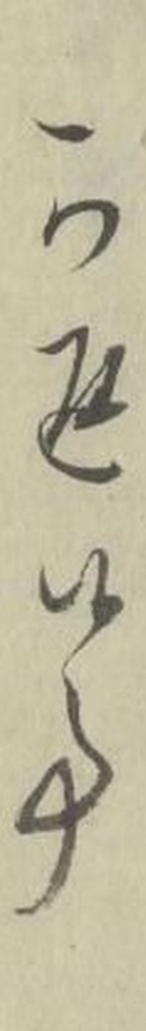可通候事
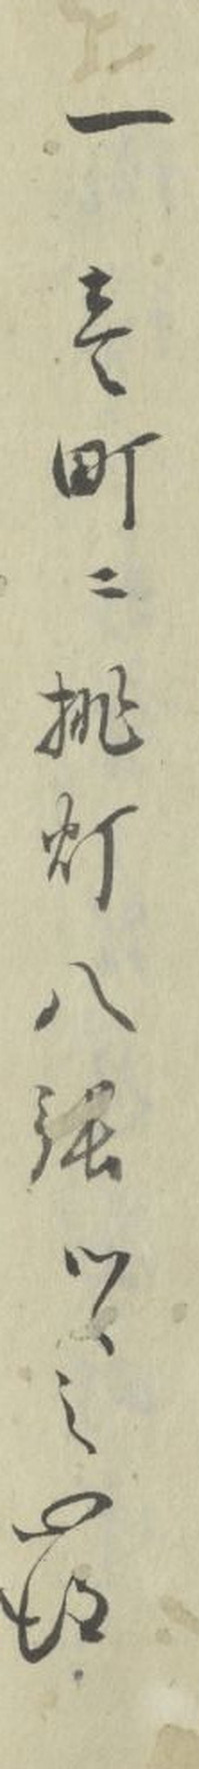一壱町に提灯八張ツヽ之心得
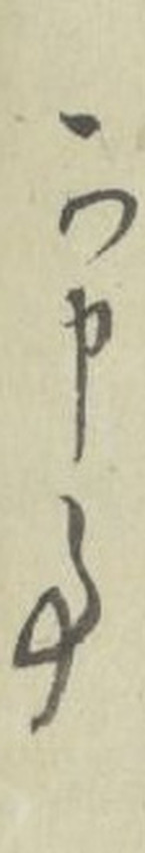可申事
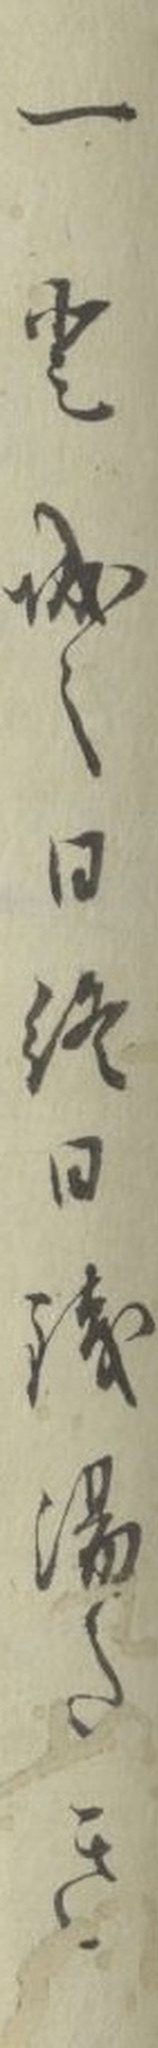一登城之日終日銭湯たき
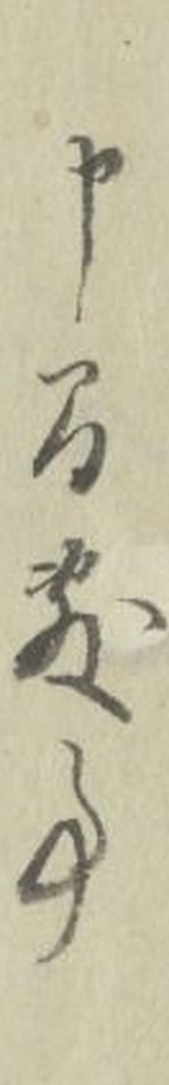申間敷事
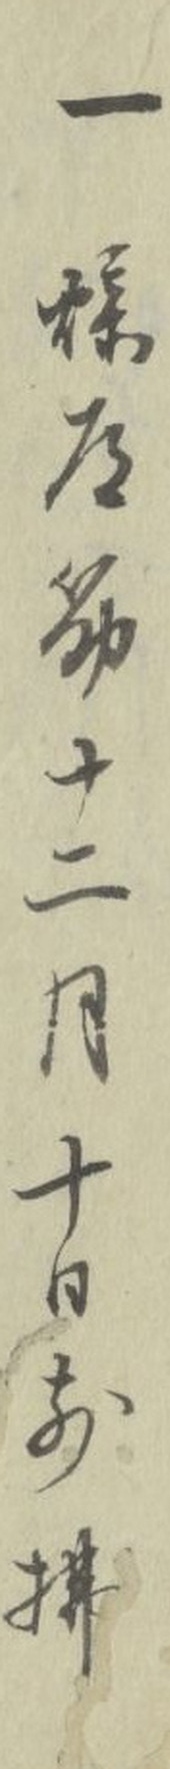一煤道筋十二月十日前払
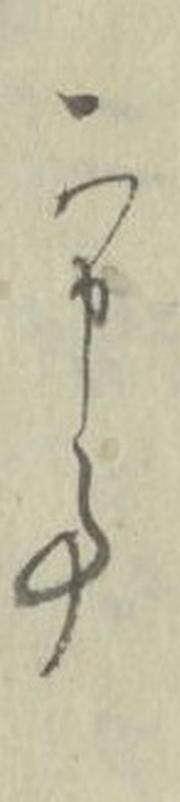可申事
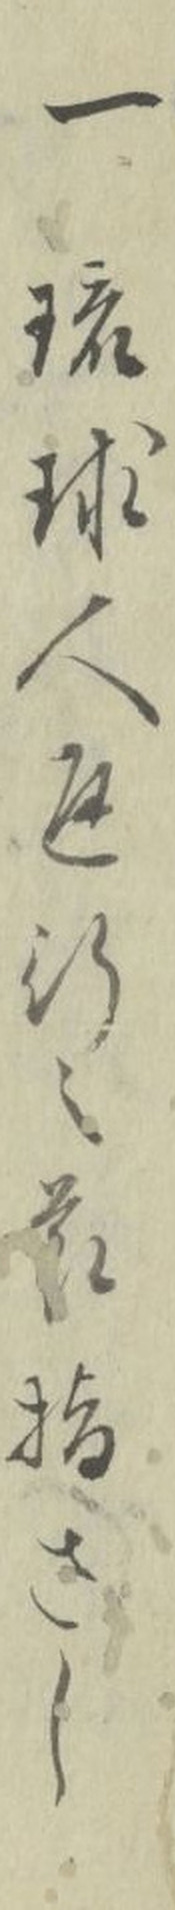一琉球人通行之節指さし
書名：琉球来朝記 自一至七
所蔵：University of the Ryukyus Library
